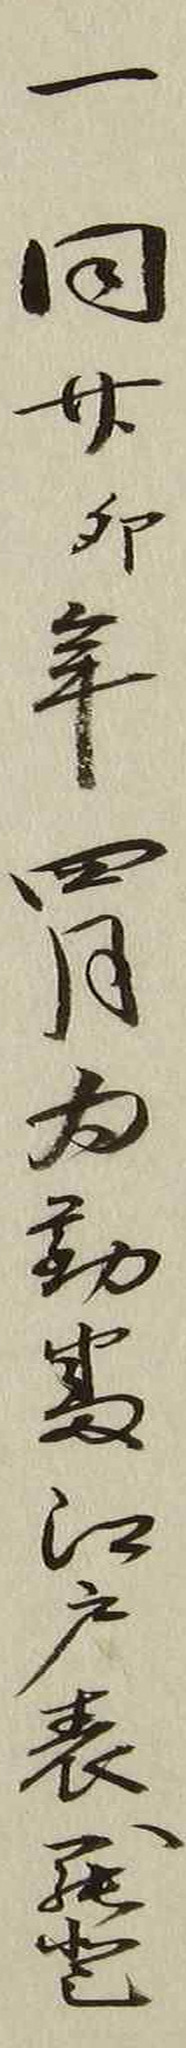一同廿卯年四月為勤番江戸表へ罷登
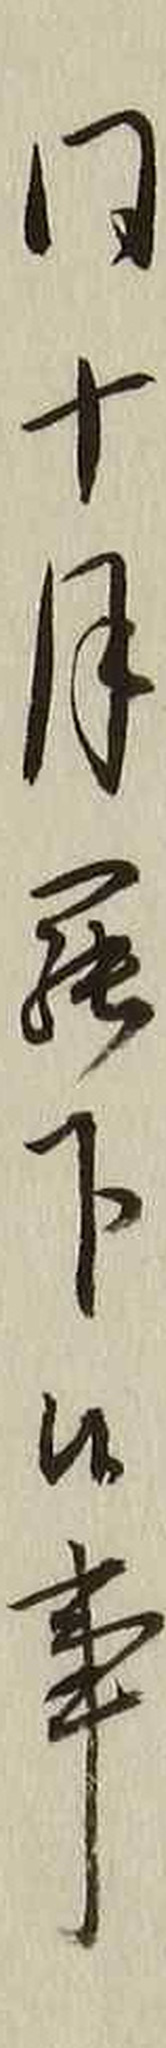同十月罷下候事
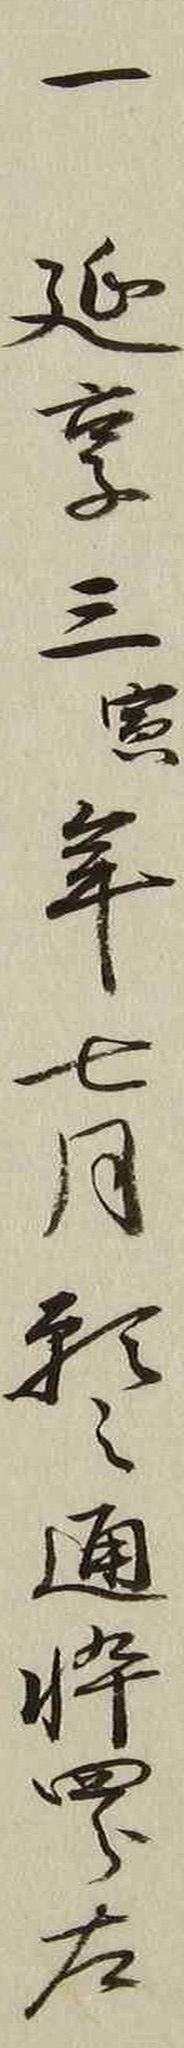一延享三寅年七月願之通忰四郎左
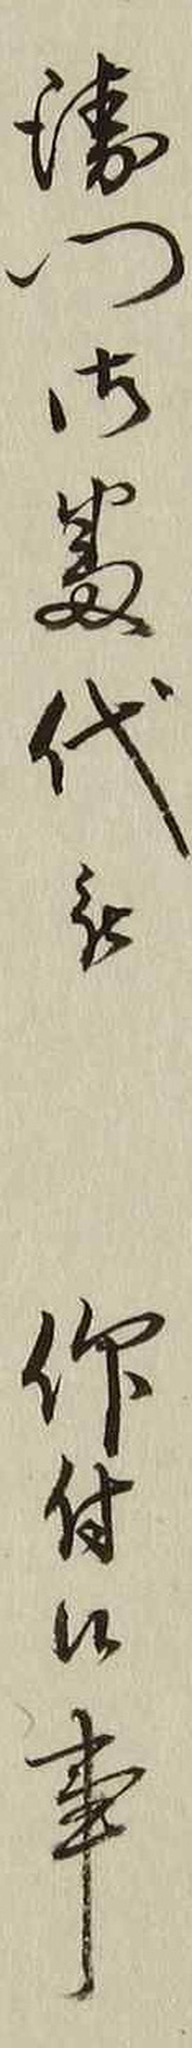衛門御番代被仰付候事
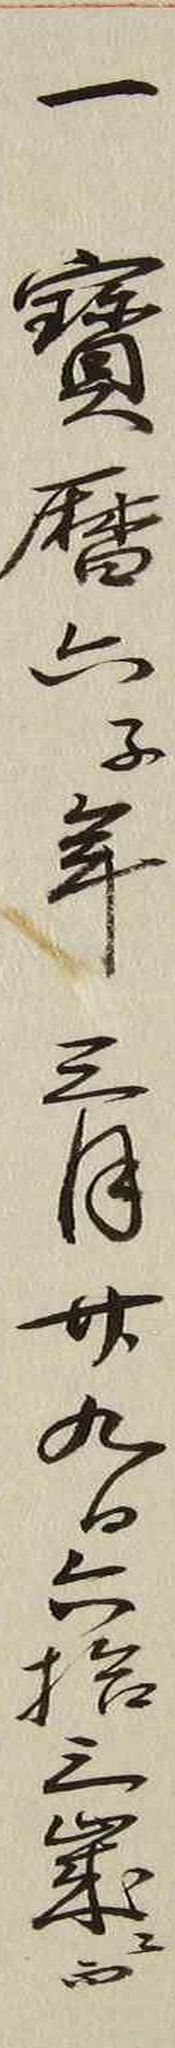一宝暦六子年三月廿九日六拾三歳ニ而
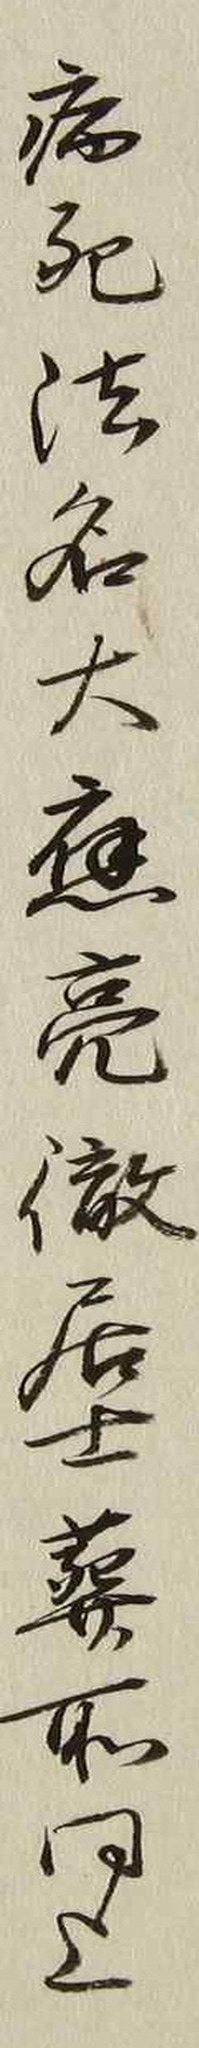病死法名大応亮徹居士葬所同上
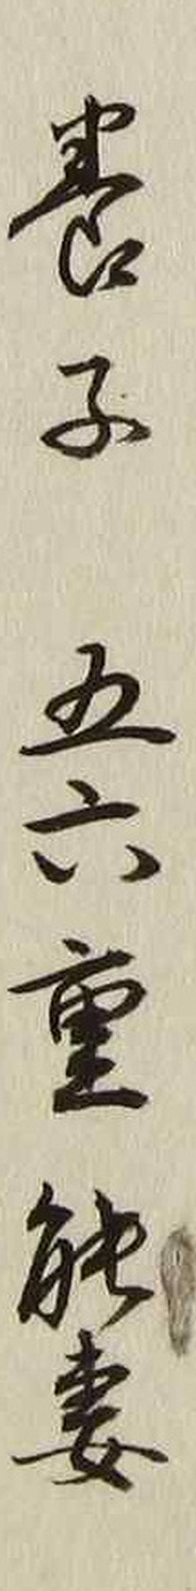養子五六重能妻
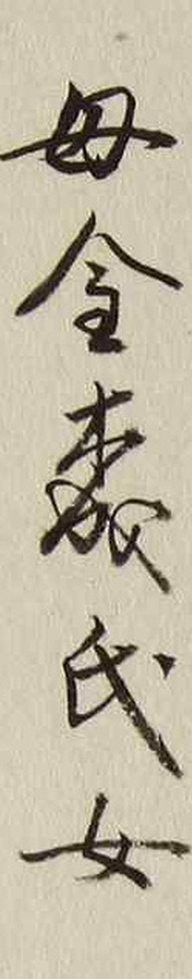母金森氏女
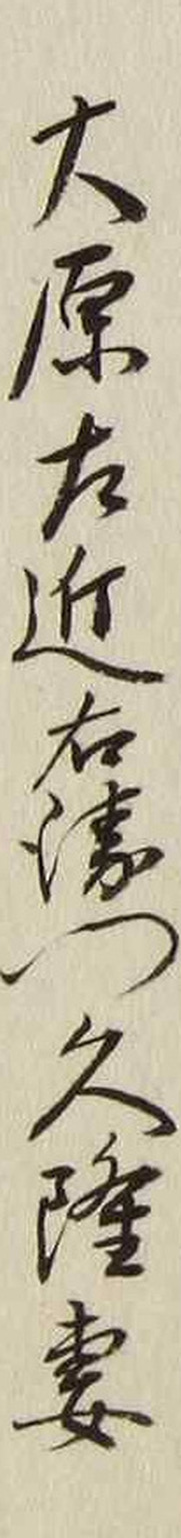大原左近右衛門久隆妻
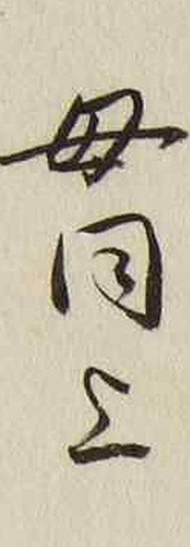母同上

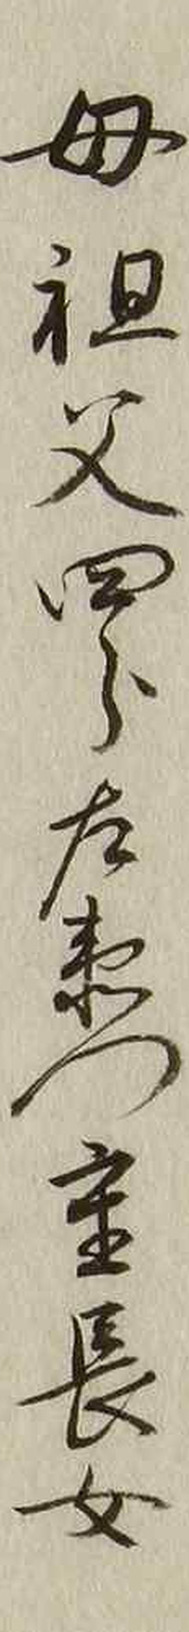母祖父四郎左衛門重長女
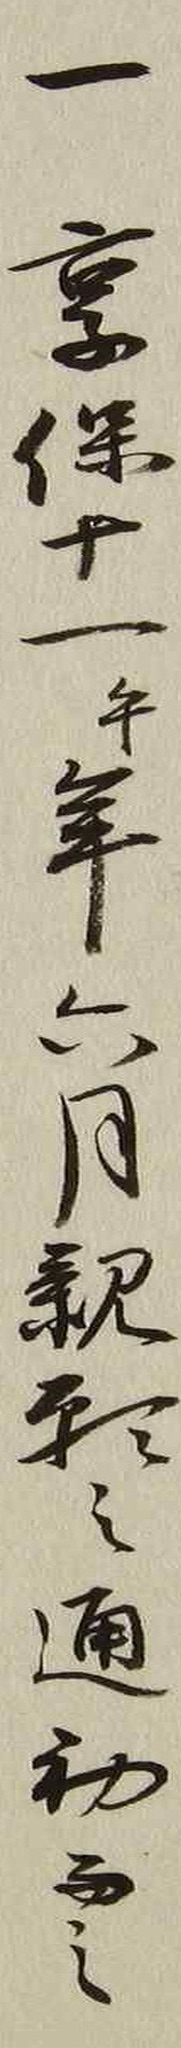一享保十一午年六月親願之通初而之
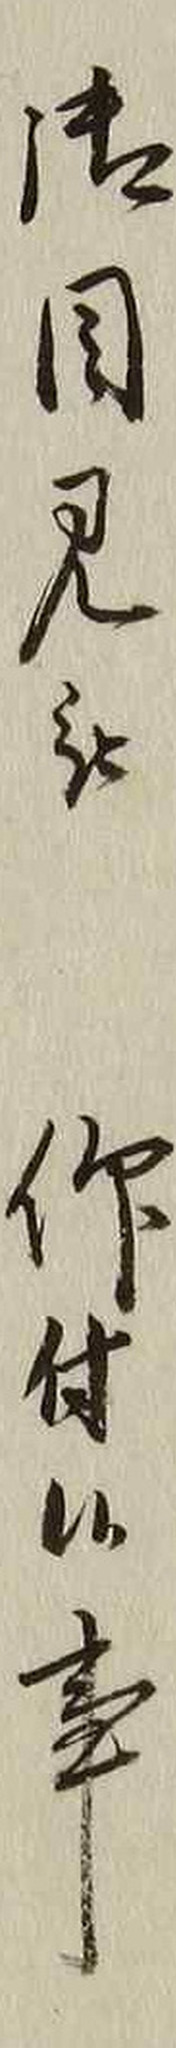御目見被仰付候事
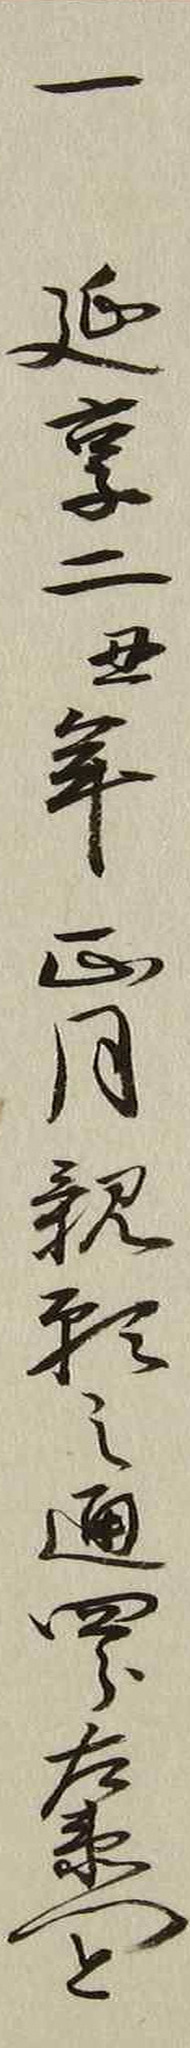一延享二丑年正月親願之通四郎左衛門と
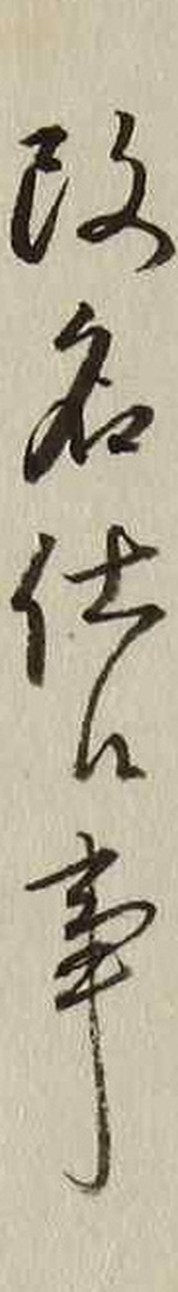改名仕候事
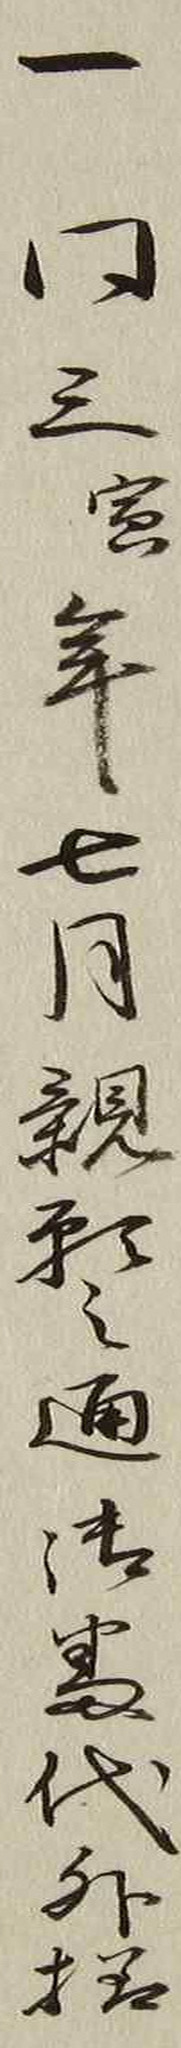一同三寅年七月親願之通御番代外様
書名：諸士系譜　巻之149　そ之部2
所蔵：会津若松市立会津図書館
